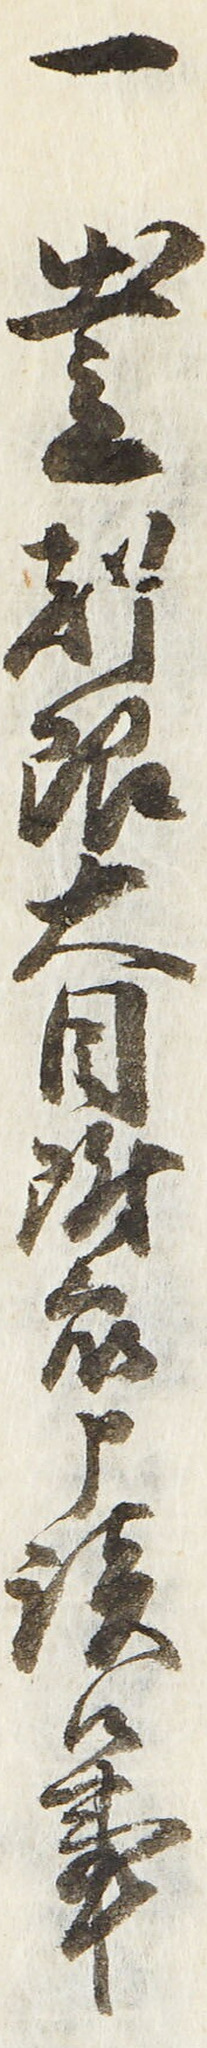一出立刻限大目付衆申談候事
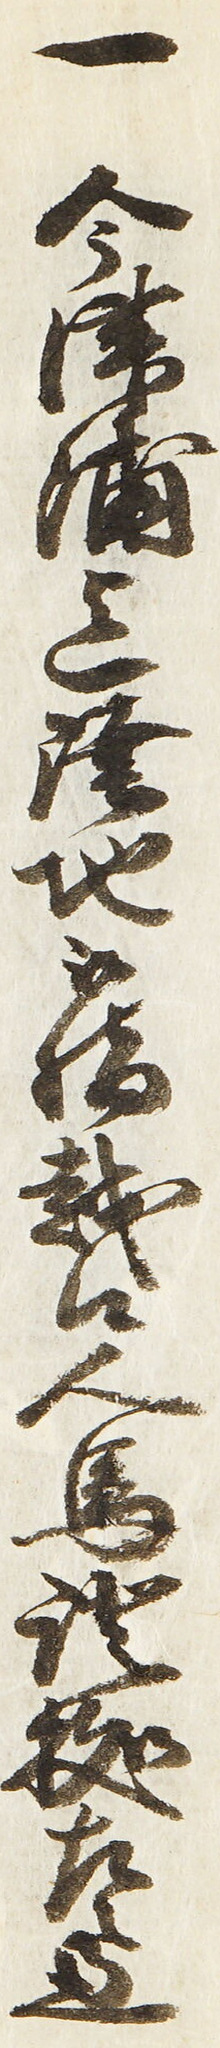一今津浦迄陸地被指越候人馬証拠左之通
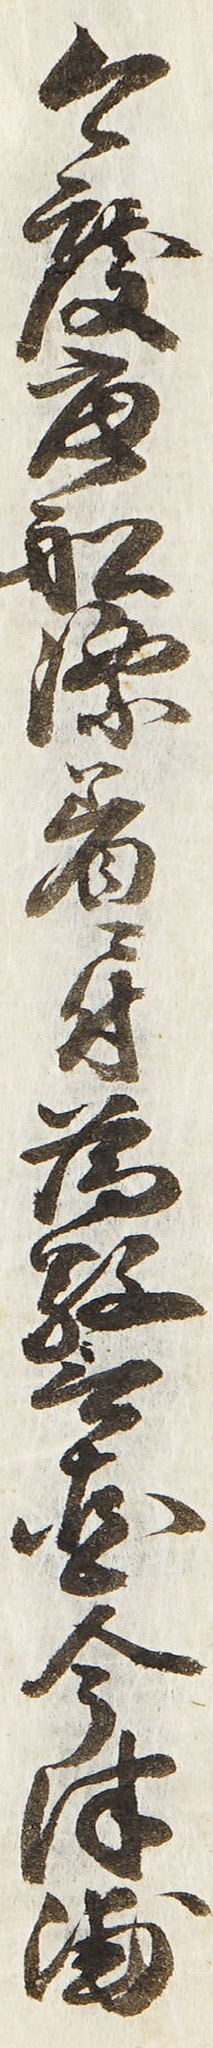今度唐船漂着ニ付為警固今津浦
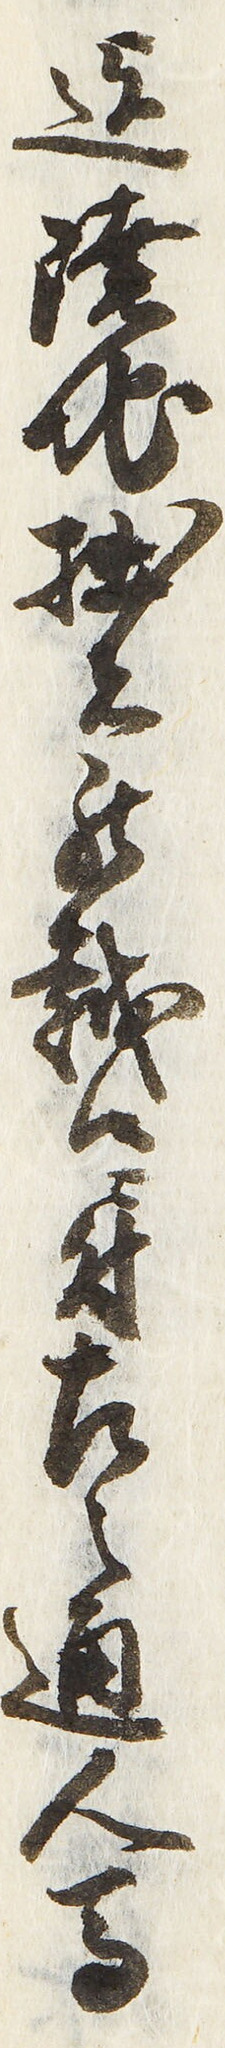迄陸地拙者罷越候ニ付左之通人馬
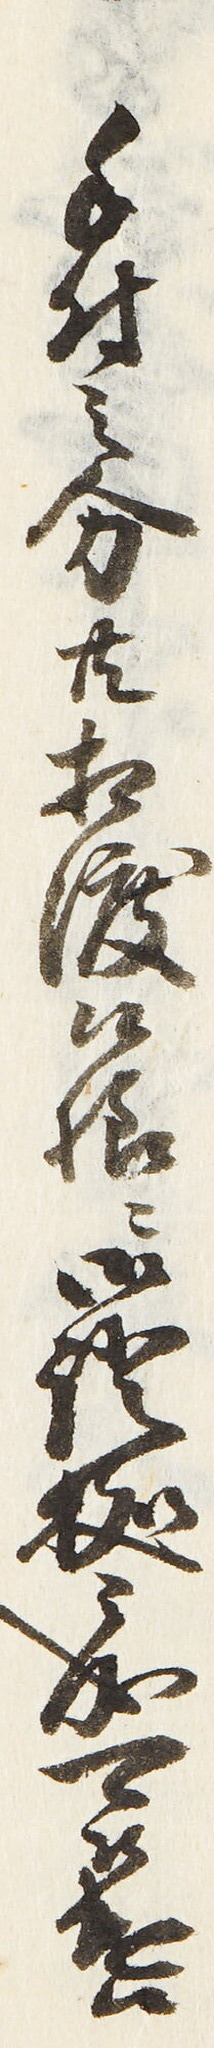手付之分共相渡候様ニ御証拠ニ成可被遣候
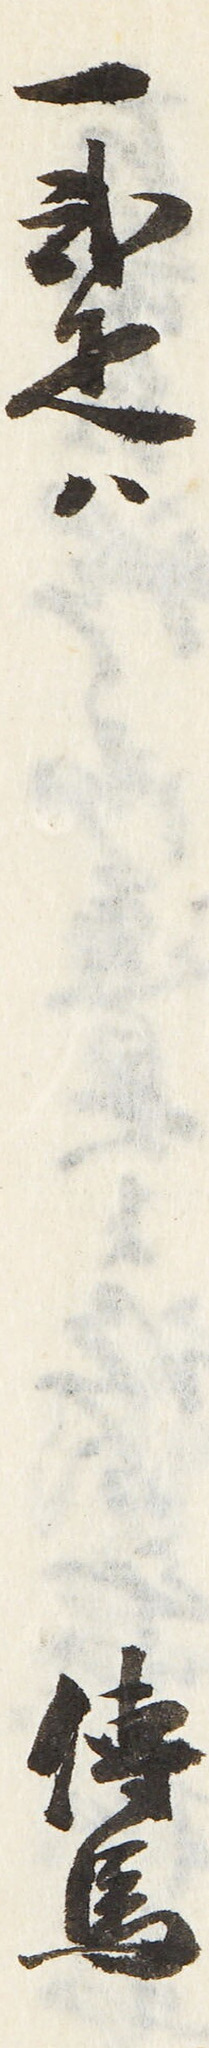一弐疋ハ伝馬
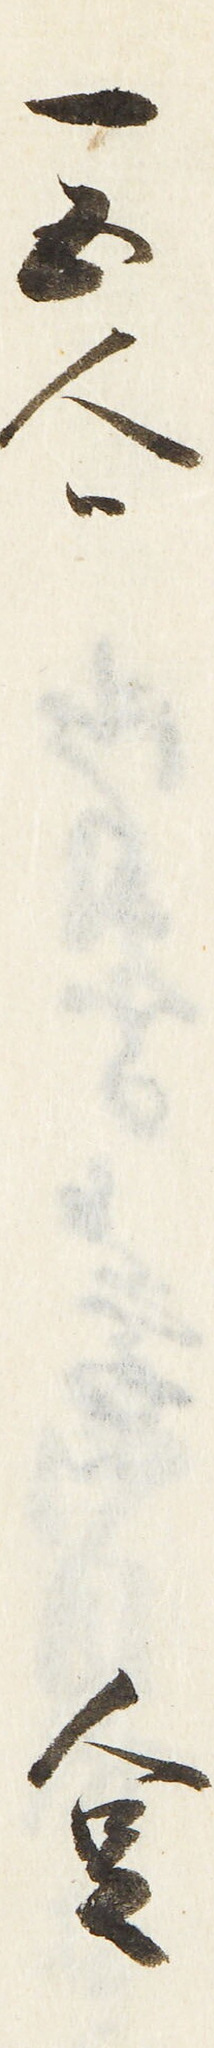一五人ハ人足
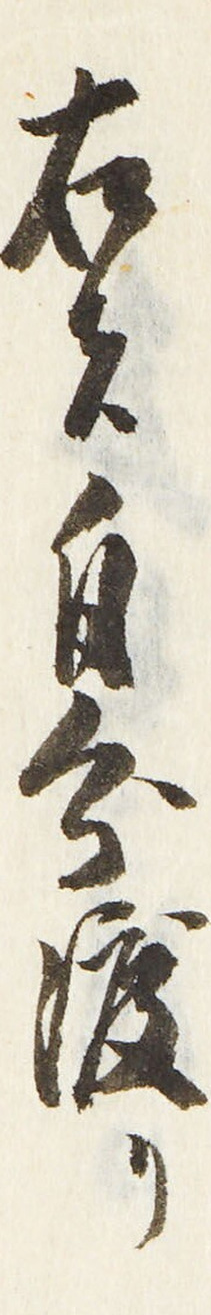右者自分渡り
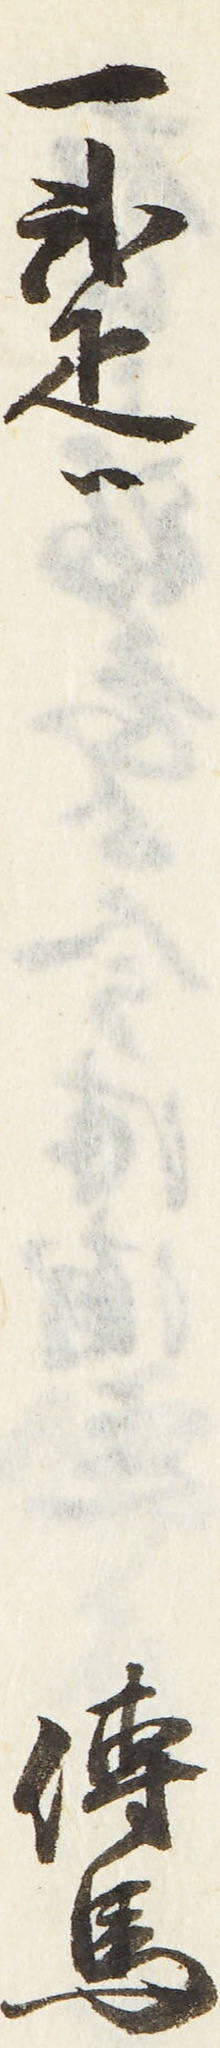一弐疋ハ伝馬
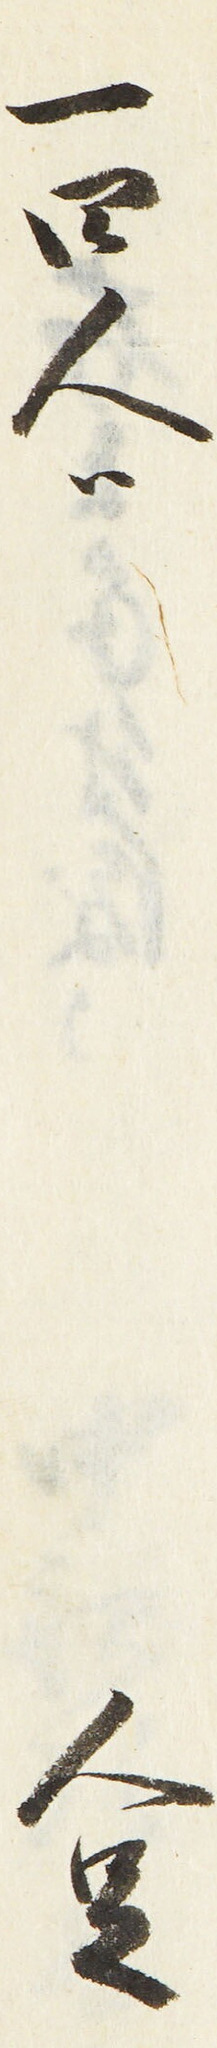一四人ハ人足

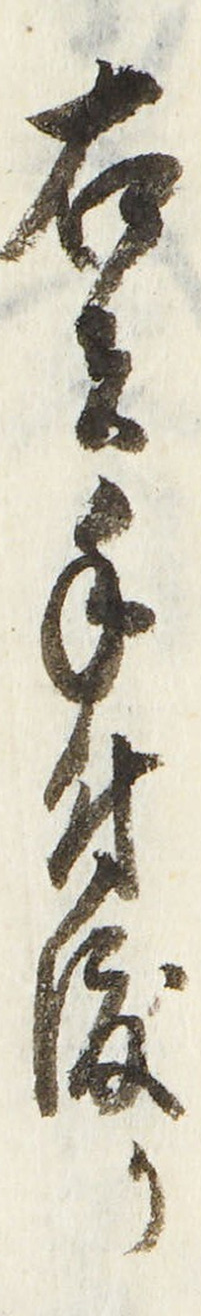右者手付渡り
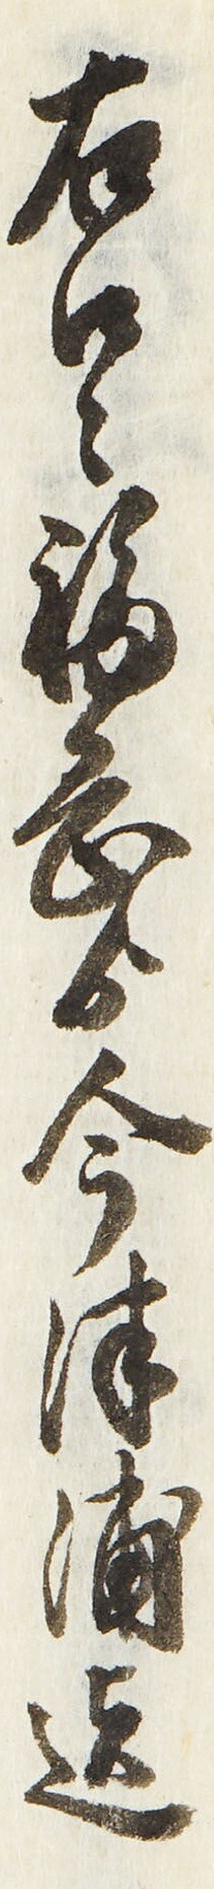右口々福岡ゟ今津浦迄
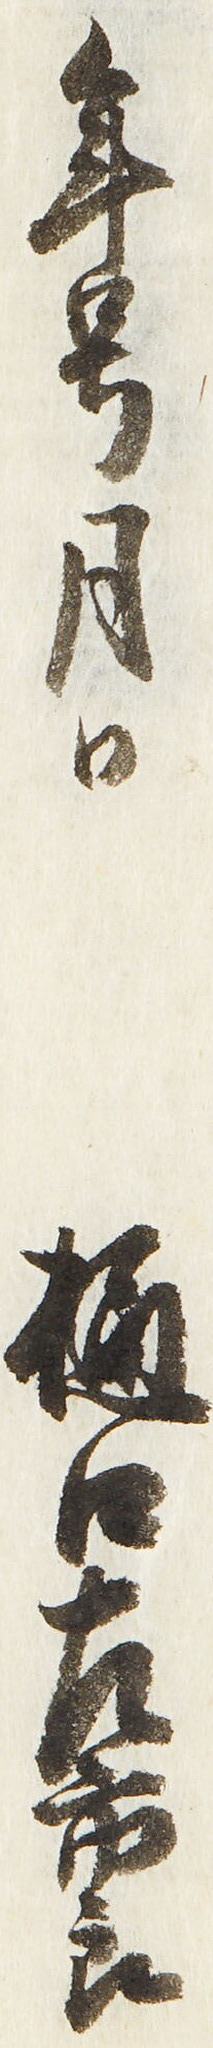年号月日樋口左市郎
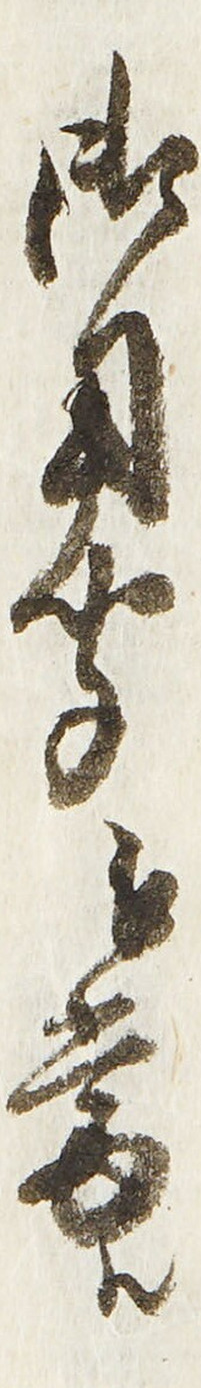御用聞江当ル
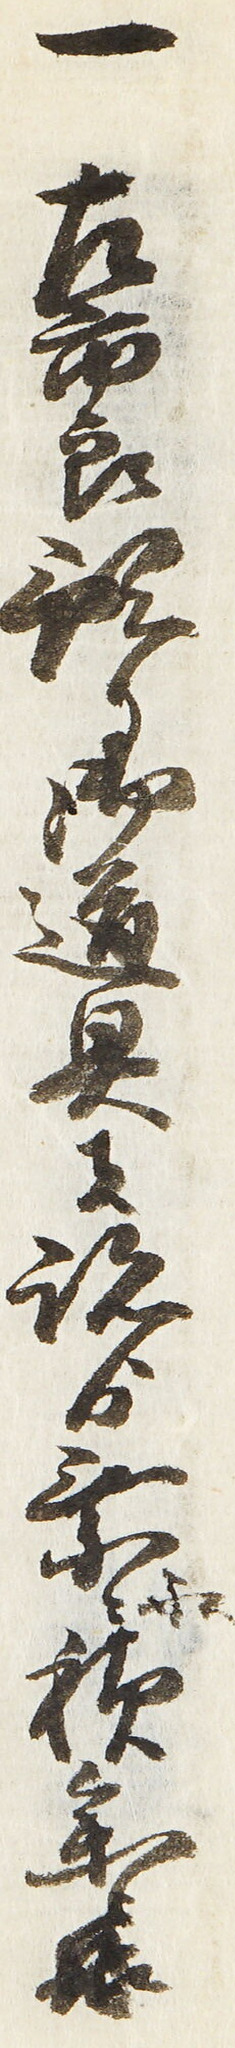一左市郎預り御道具者跡ゟ乗船ニ積参
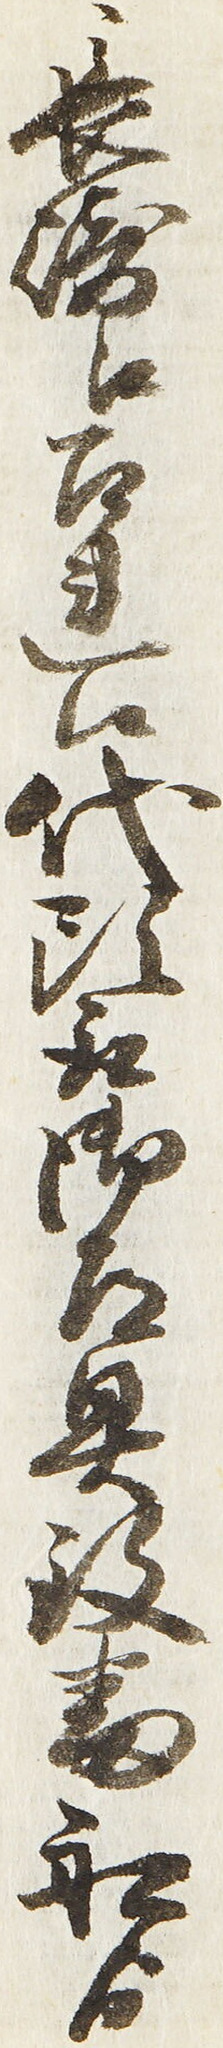長崎江召連候代頭取御道具致番船ゟ
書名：玄海嶋江漂着船為警固長崎江被越候覚
